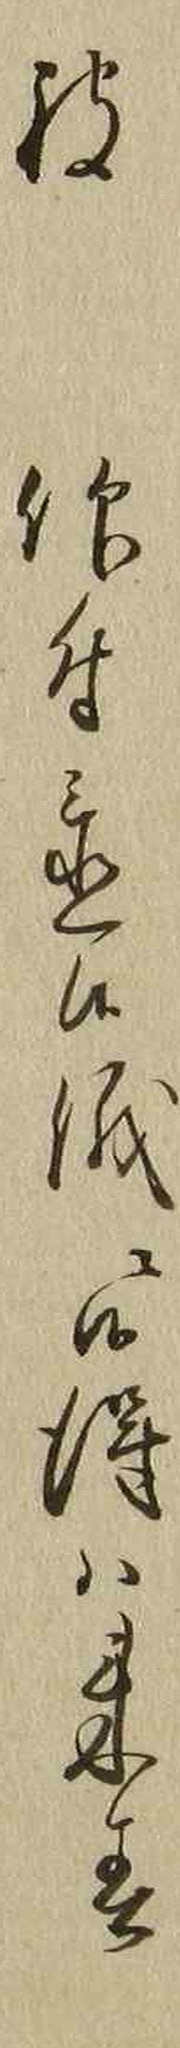被仰付置候儀ニ候得ハ来春
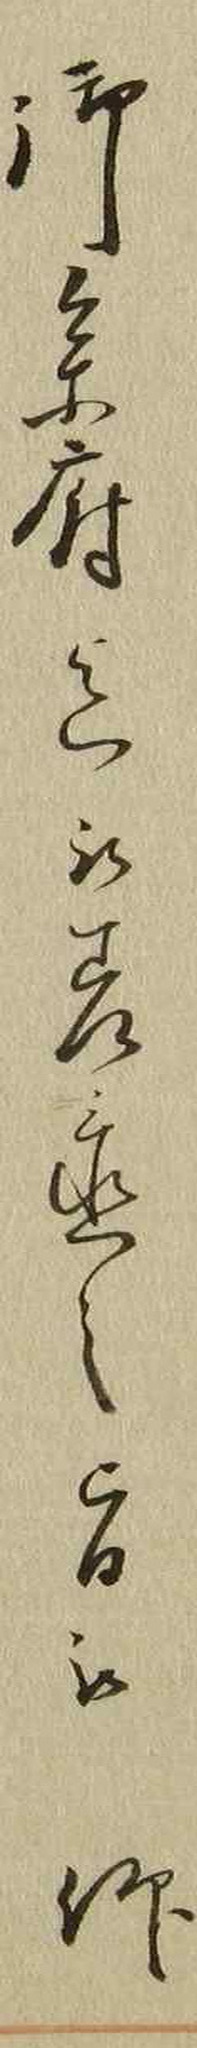御参府迄被差置之旨被仰
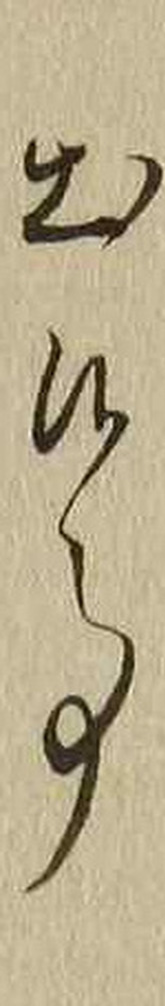出候事
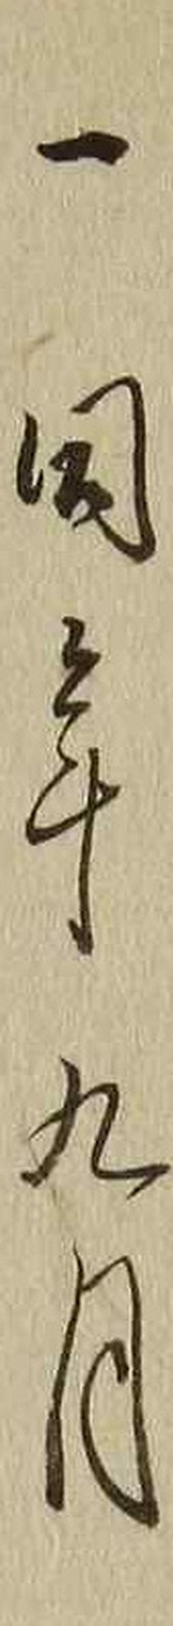一同年九月
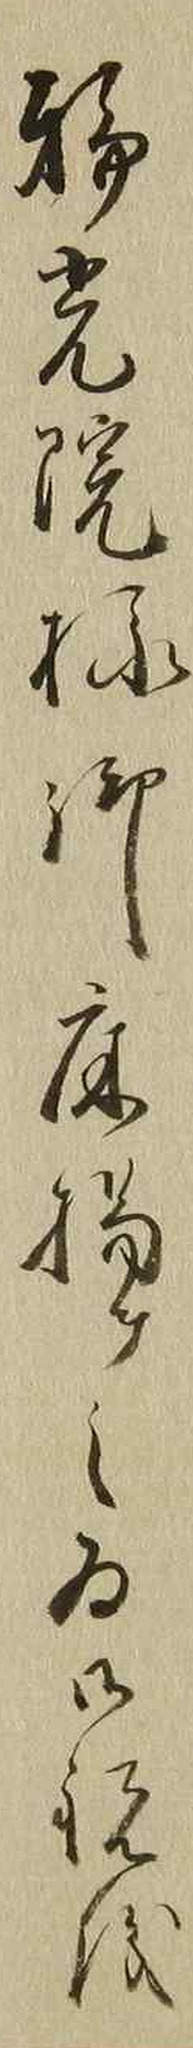輪光院様御床揚ケ之為御祝儀
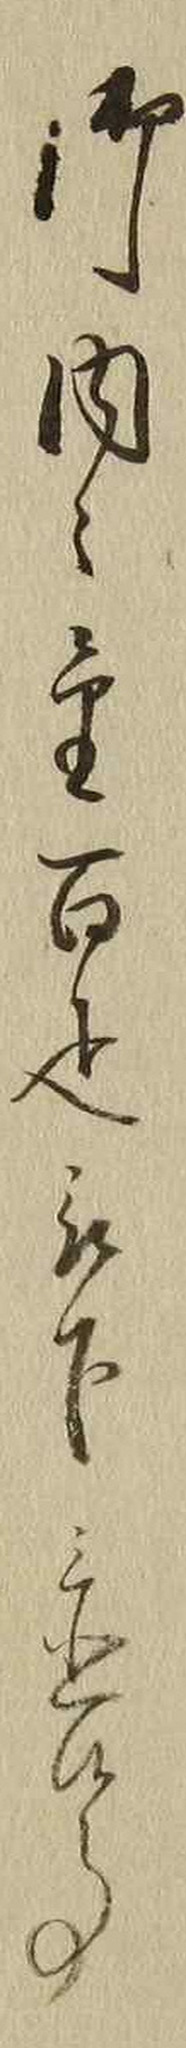御内々金百疋被下置候事
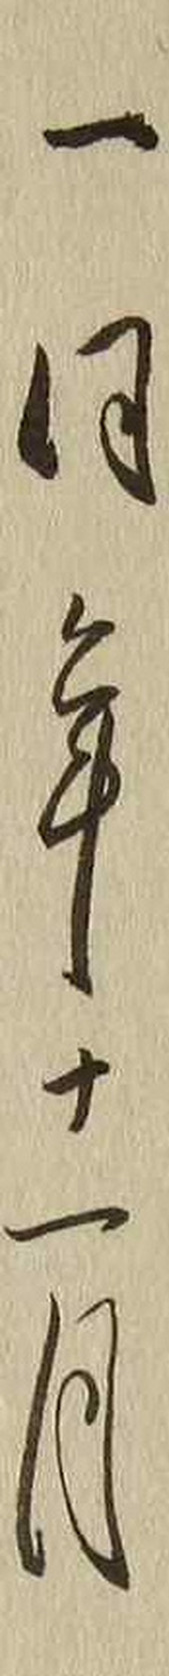一同年十一月
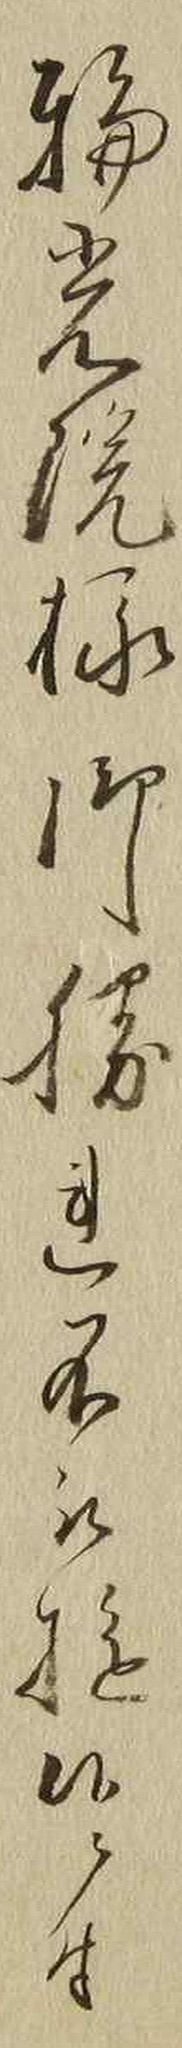輪光院様御勝れ不被遊候ニ付
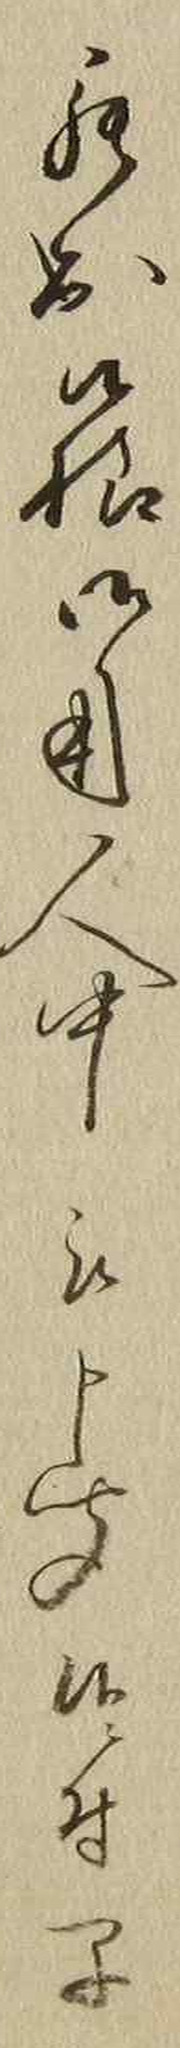罷出候様御用人中被申聞候ニ付早
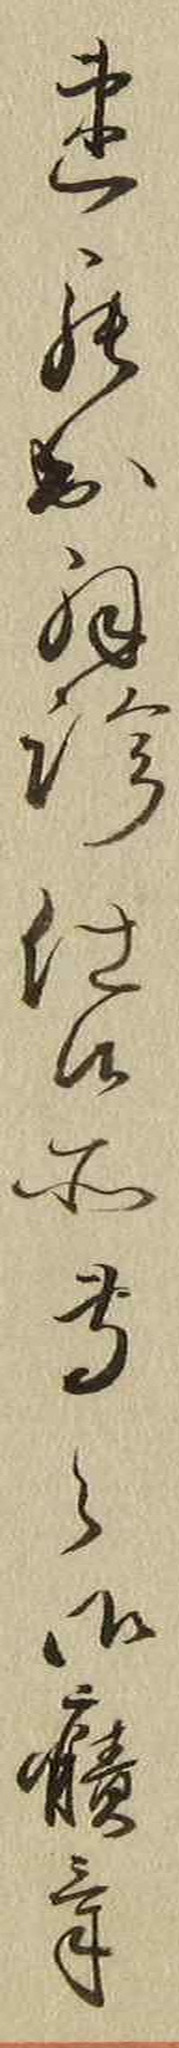速罷出拝診仕候所専之御癪気
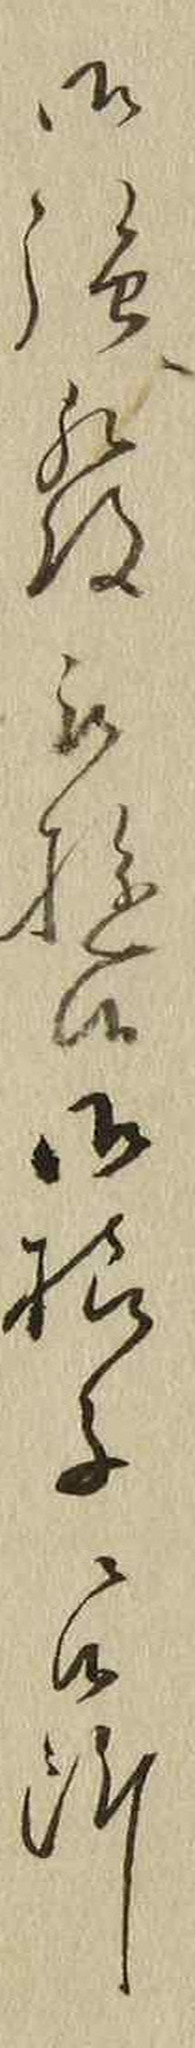御強発被遊候御様子ニ候所
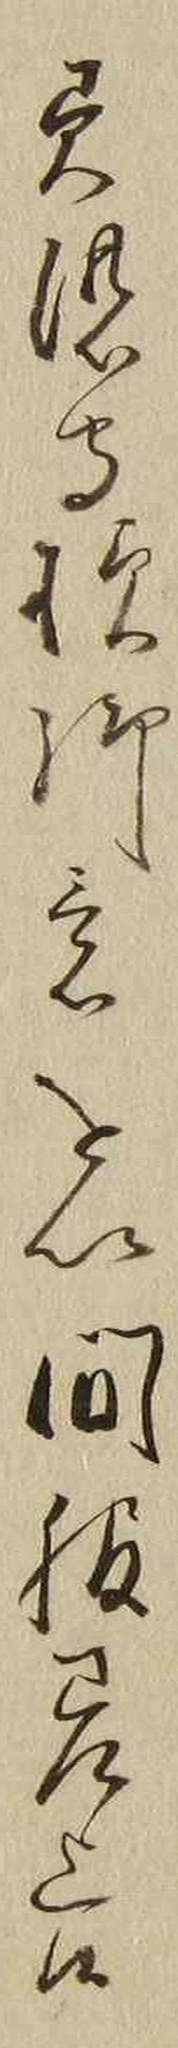美濃守様御意を以間服差上候
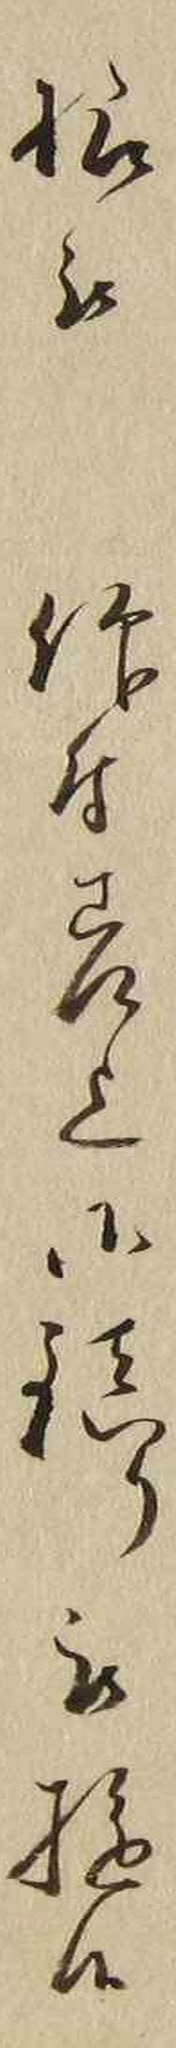様被仰付差上御鎮り被遊候
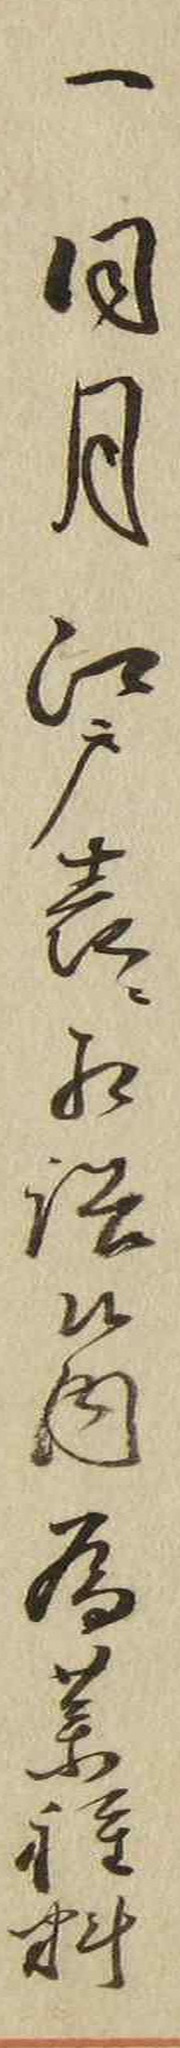一同月江戸表ニ相詰候内為薬種料

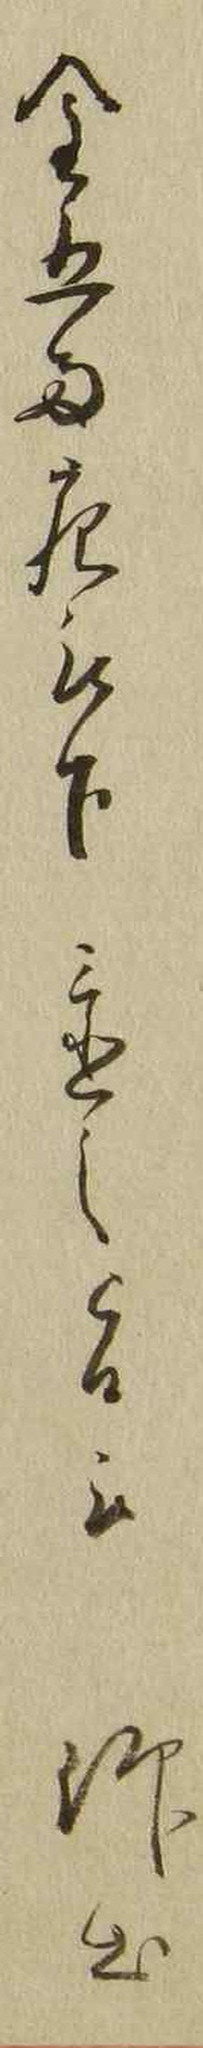金五両宛被下置之旨被仰出
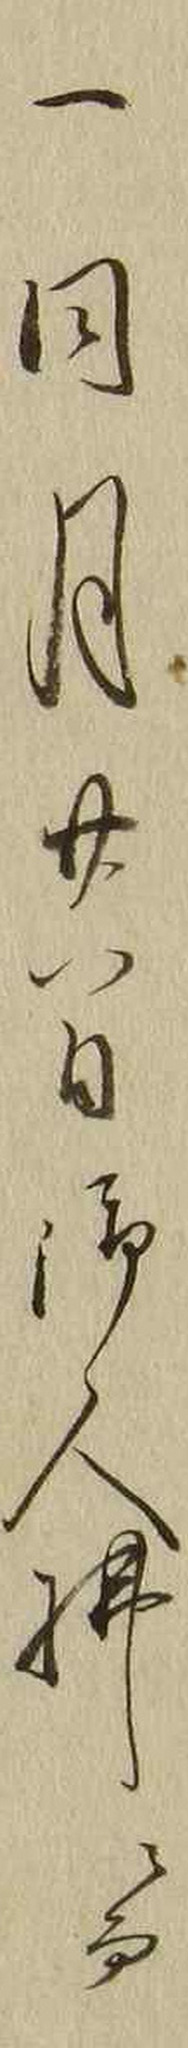一同月廿八日御人払ニ而
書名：諸士系譜　巻之68　を之部2
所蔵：会津若松市立会津図書館
